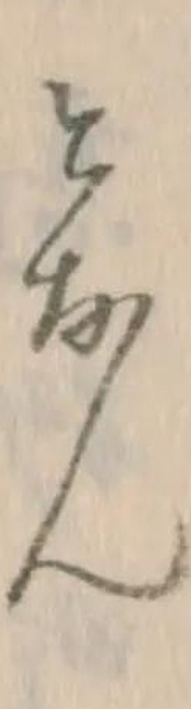となん
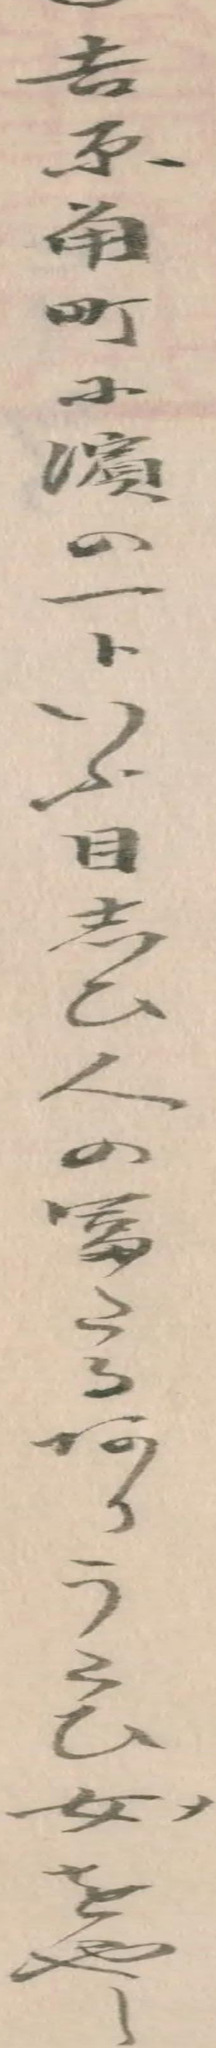○吉原角町に浜の一トいふ目しひ人の富たるありうたい女をやし
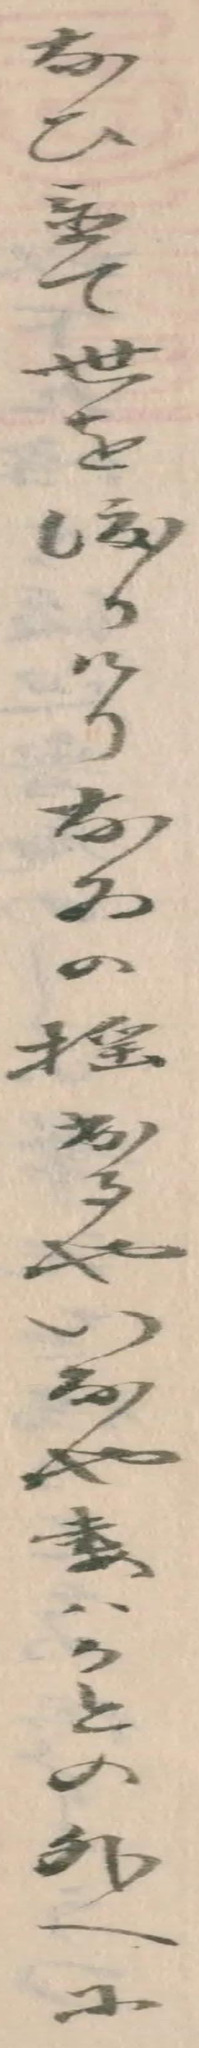なひ置て世を渡りけりなゐの揺出るやいなや妻はかとの外へに
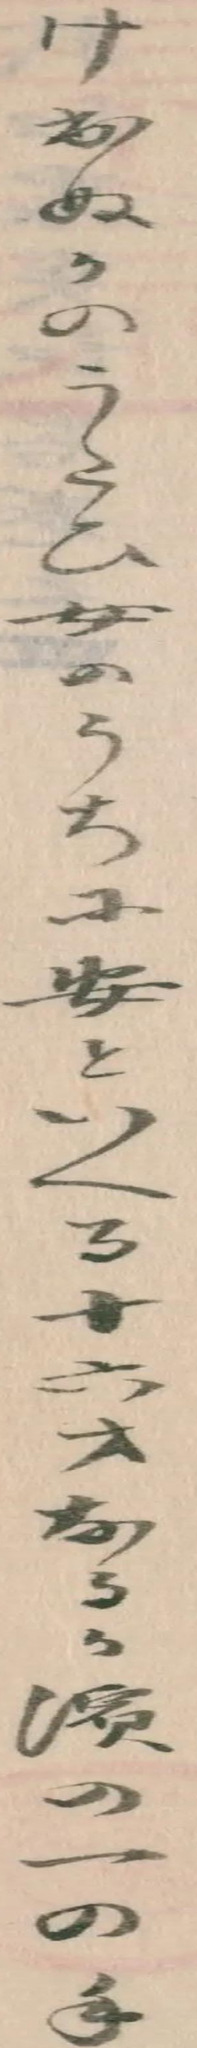け出ぬかのうたひ女のうちに安といへる十六才なるか浜の一の手
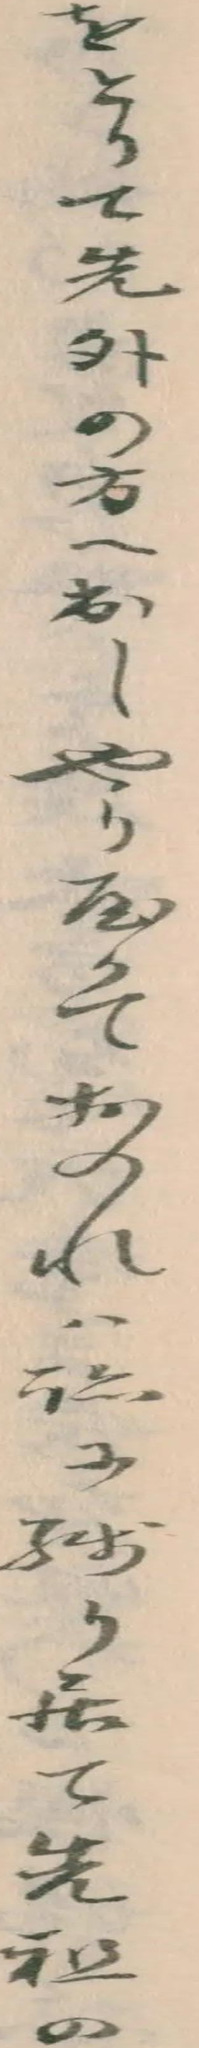をとりて先外の方へ出しやりやかておのれは跡に残り居て先祖の
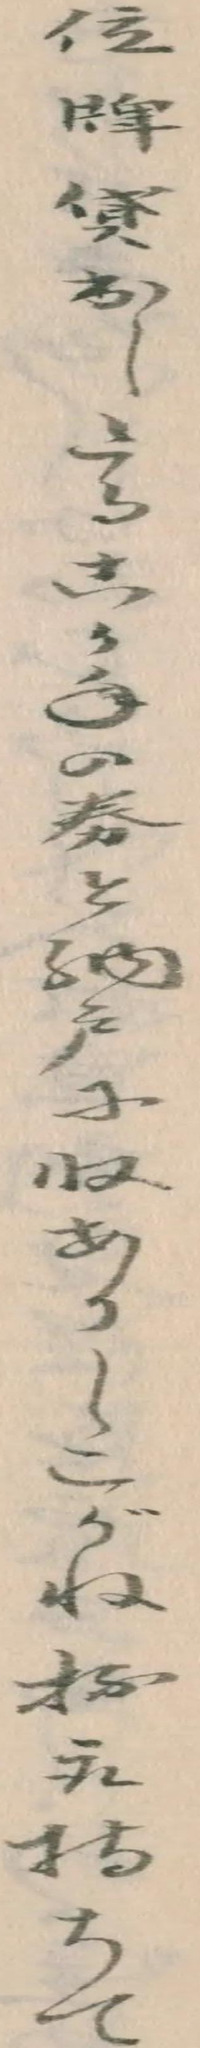位牌貸出したるこかねの券と納戸に収ありしこがね抔取持ちて
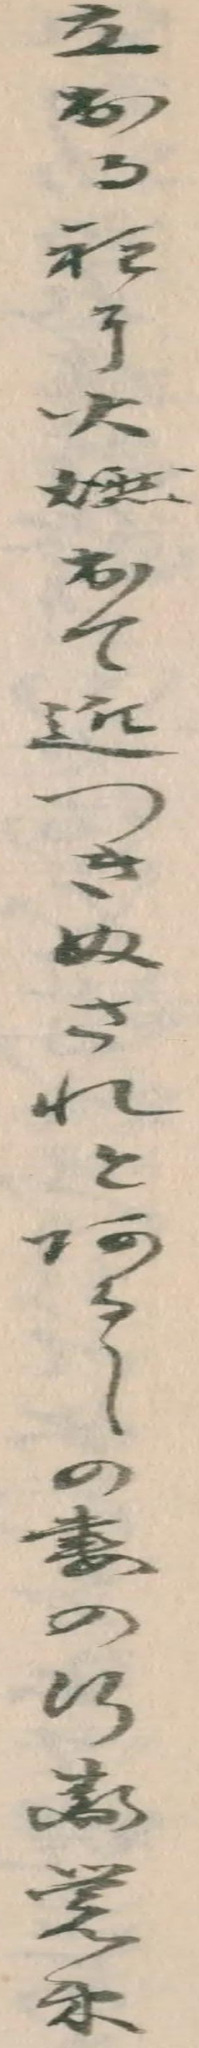立出る程に火燃出て近つきぬされとあるしの妻の行ゑ覚束
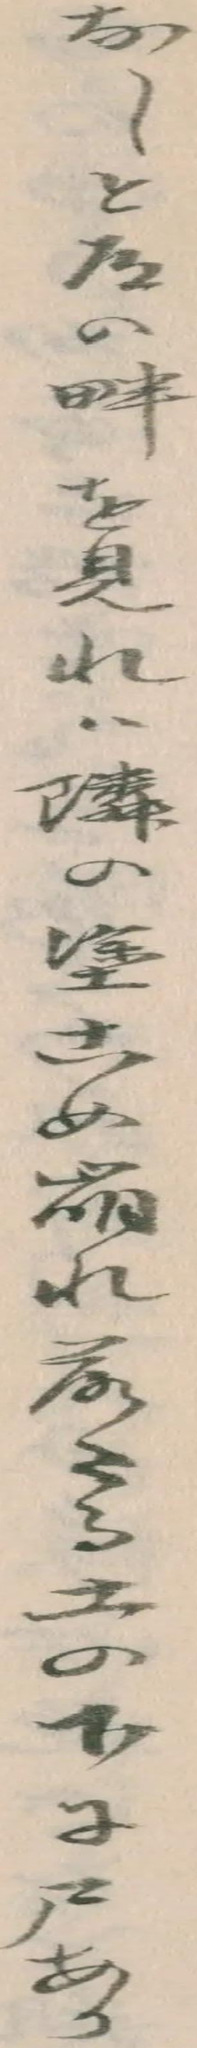なしと道の畔を見れは隣の塗こめ崩れ落たる土の下に屍あり
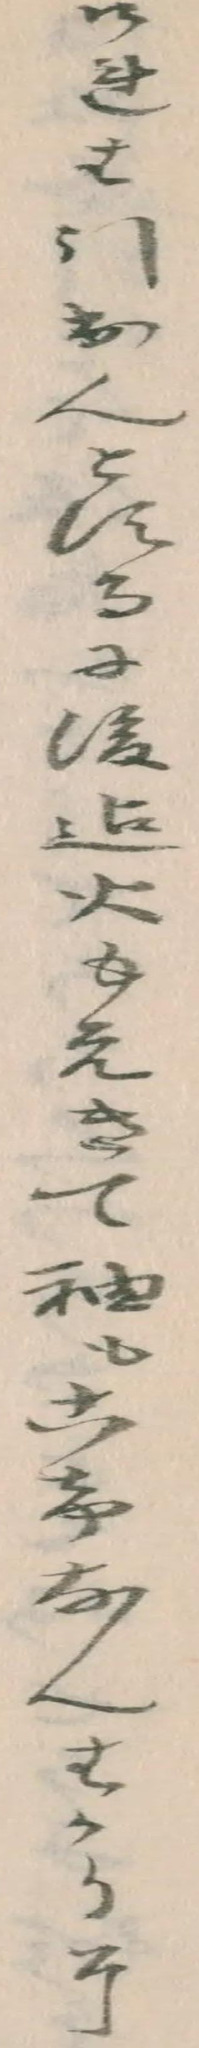けれは引出んとするに後迄火もえきて袖もこけなんはかりに
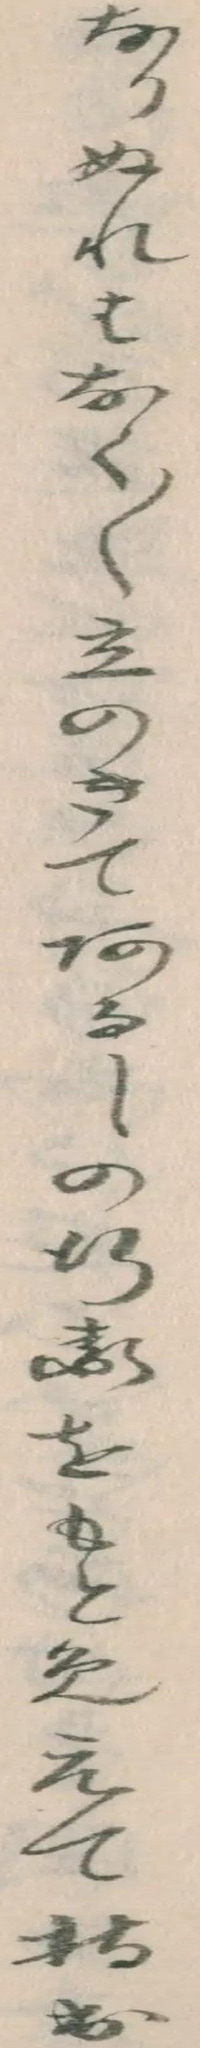なりぬれはなく〳〵立のきてあるしの行ゑをもとめえて持出
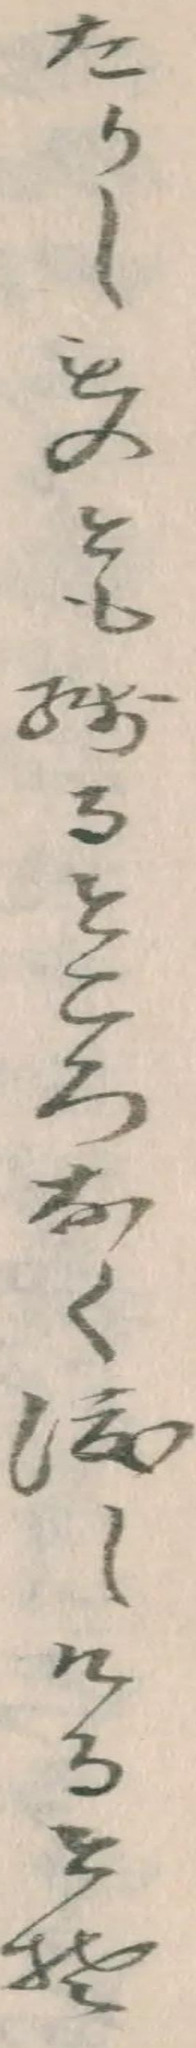たりしものとも残るところなく渡しけるとそ
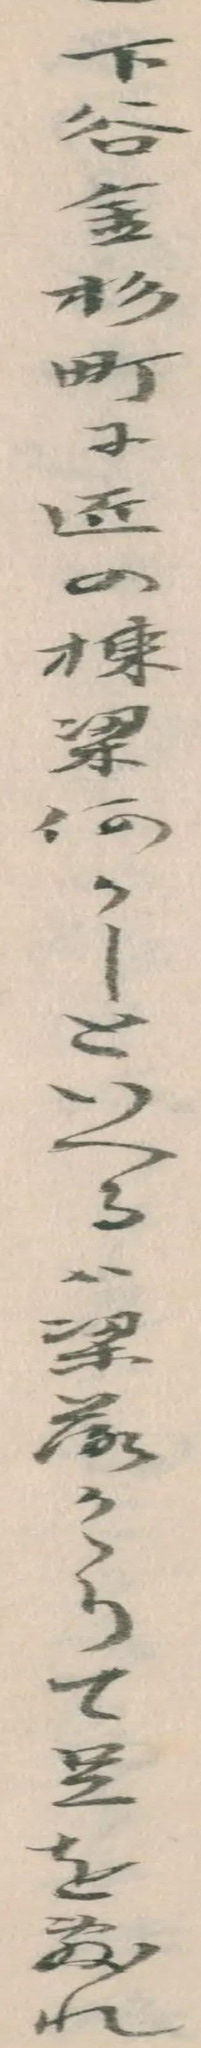○下谷金杉町に匠の棟梁何かしといへるは梁落かゝりて足を敷れ
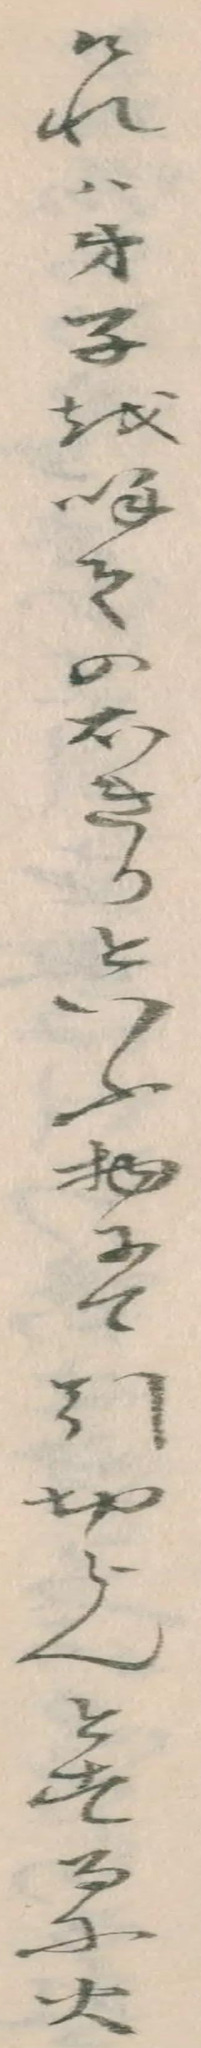けれは弟子を呼てのこきりといふ物にて引切らんとするに火
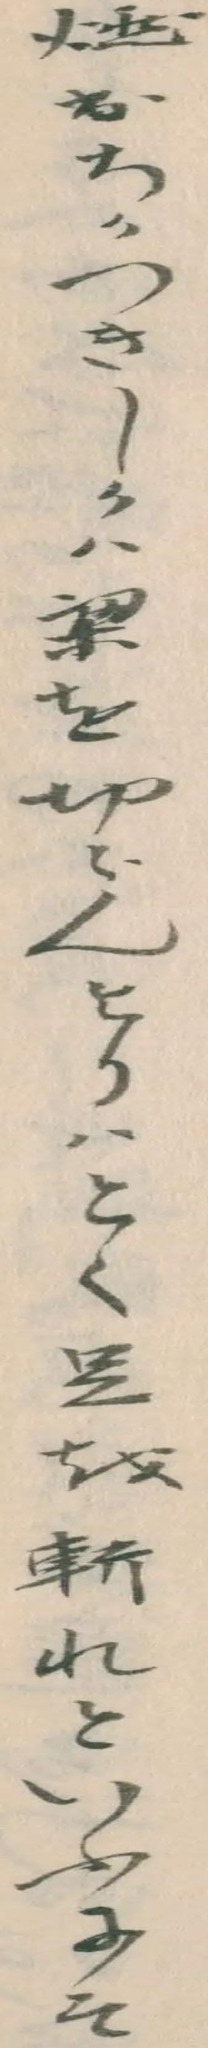燃出ちかつきしかは梁を切らんよりはとく足を斬れといふにそ

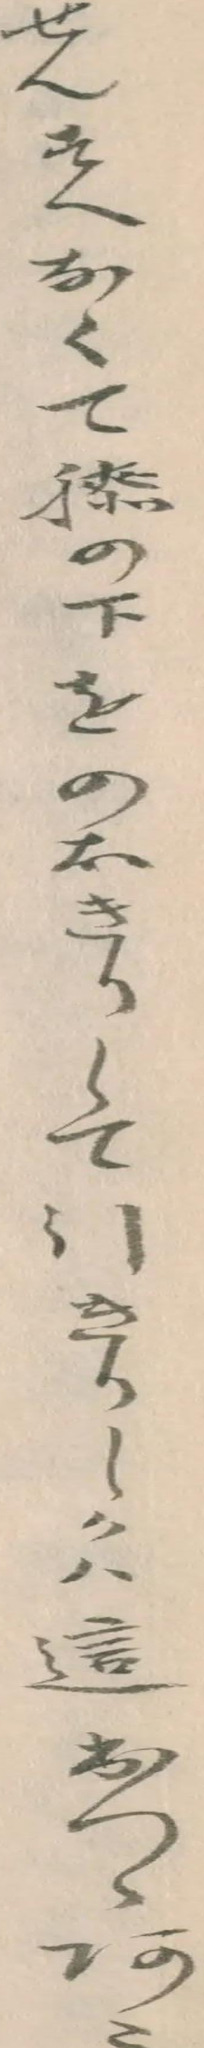せんすへなくて膝の下をのこきりして引きりしかは這出つゝあた
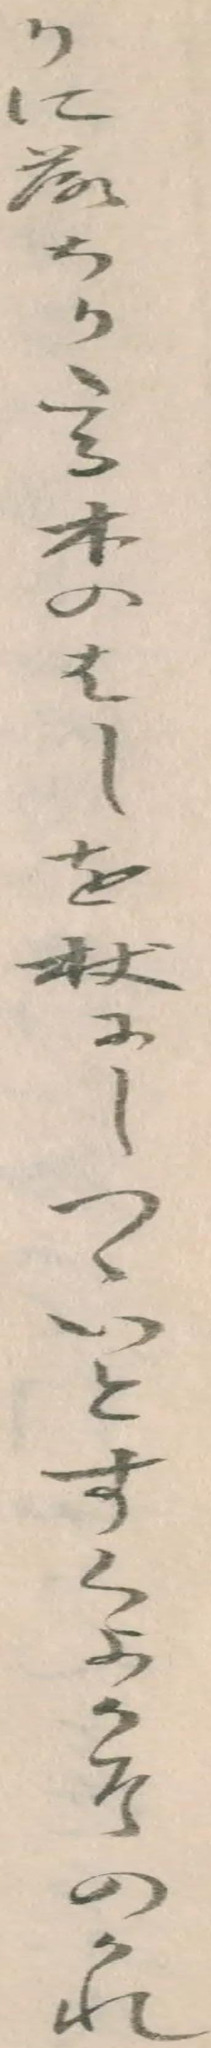りに落ちりたる木のはしを杖にしつゝいとすくよかにのかれ
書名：地災撮要. 巻10(地震之部) 上,下
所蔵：国立国会図書館 National Diet Library, JAPAN
